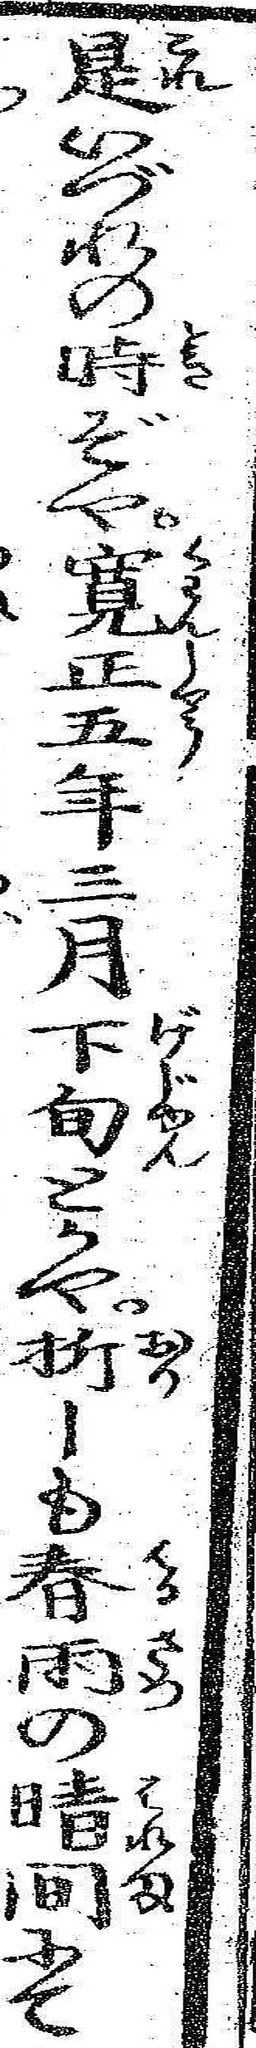是いづれの時ぞや。寛正五年三月下旬とかや。折しも春雨の晴間にて
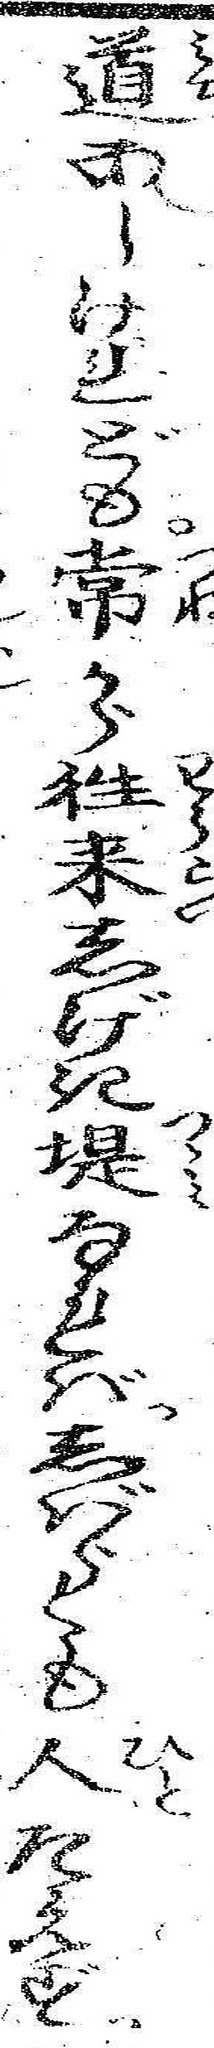道あしけれども。常から往来しげき堤なれば。しばらくも人たえず。
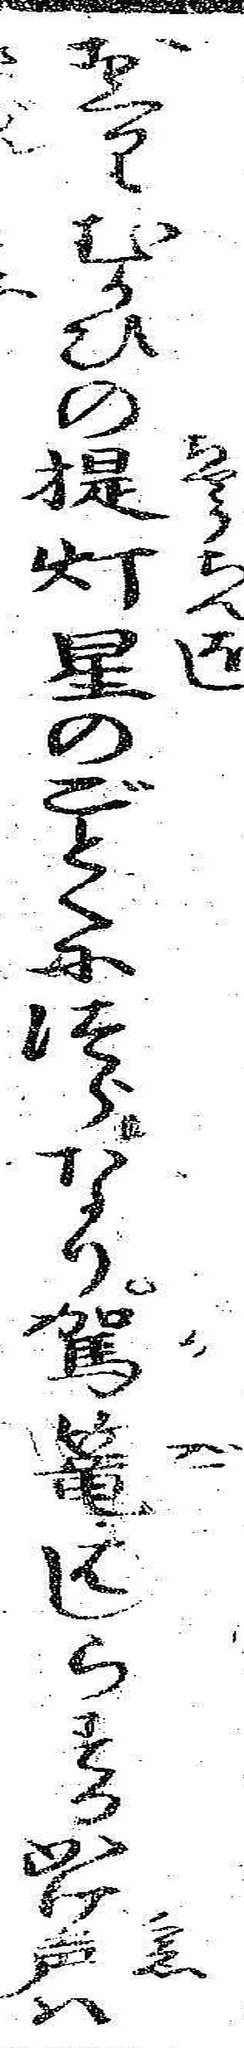おくりむかひの提灯星のごとくにつらなり。駕篭はしらするかけ声は
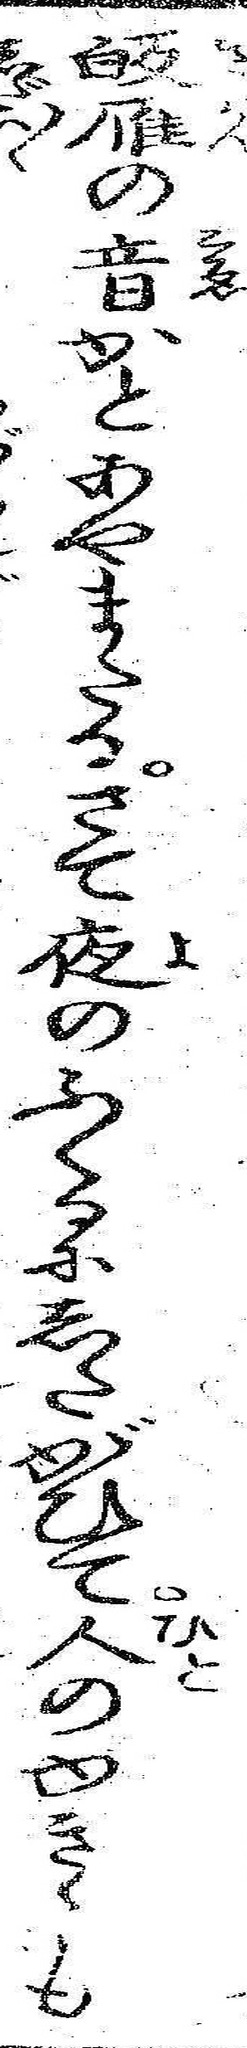帰雁の音かとあやまたる。さて夜のふくるにしたがひて。人のゆきゝも
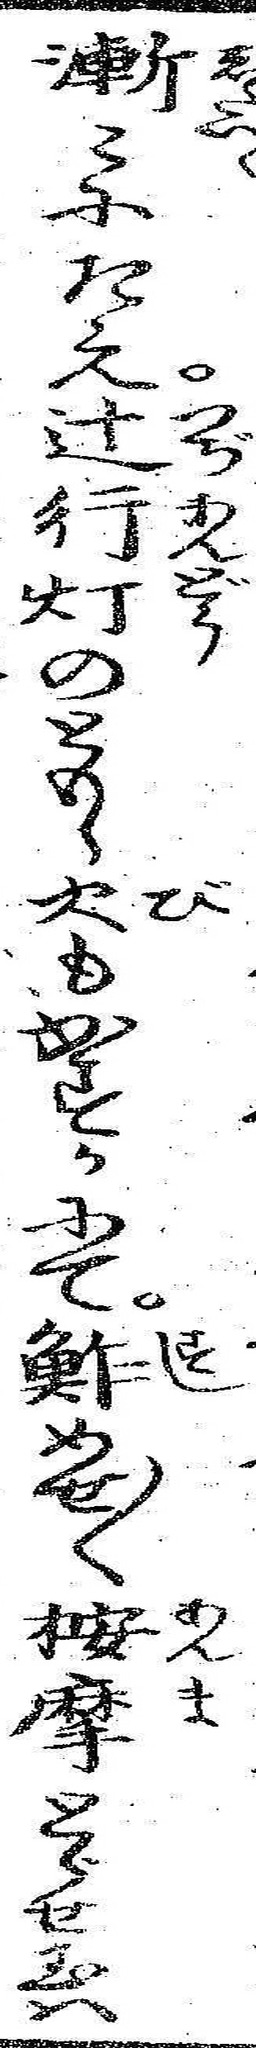漸々にたえ。辻行灯のともし火もかすかにて。鮓めせ〳〵按摩とらせ玉は
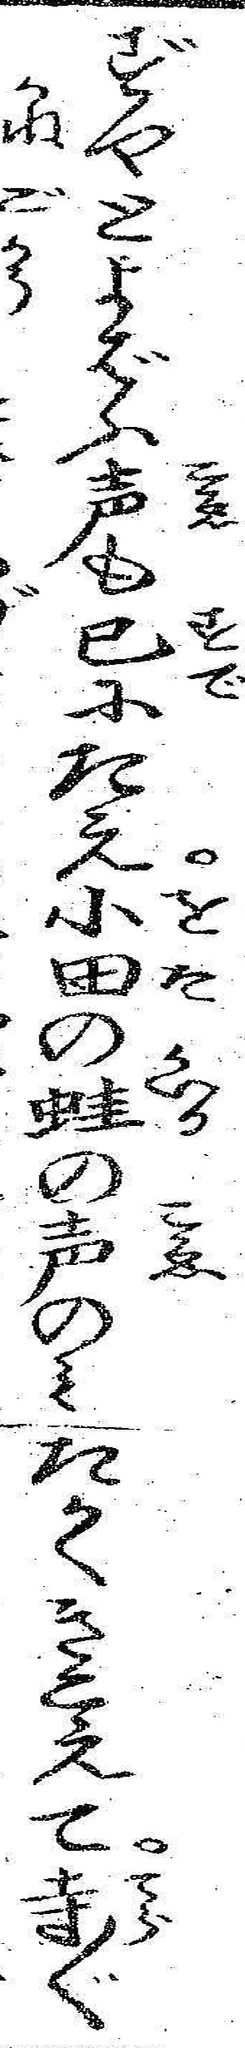ずやとよばふ声も已にたえ。小田の蛙の声のみたかくきこえて。寺
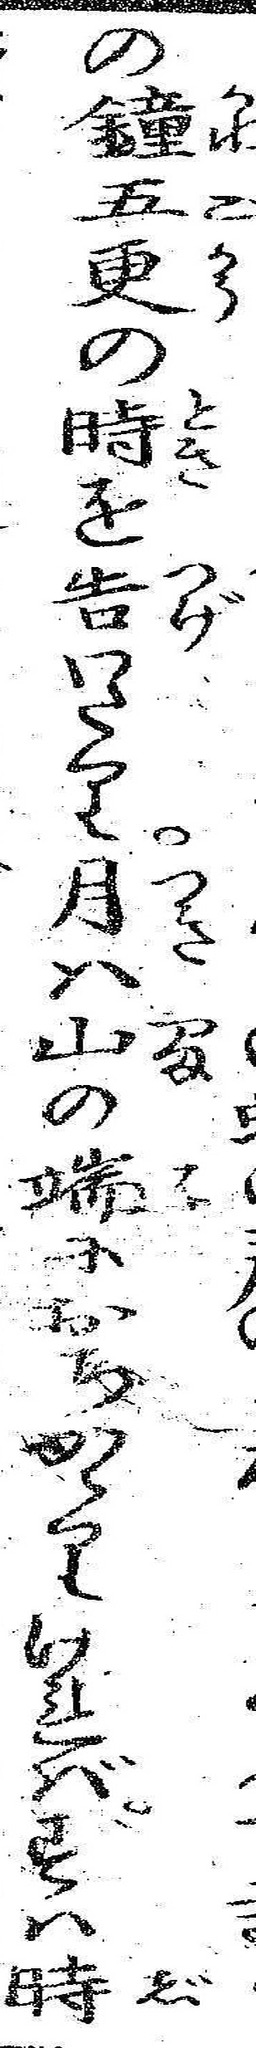の鐘五更の時を告わたり。月は山の端におちかゝりければ。すは時
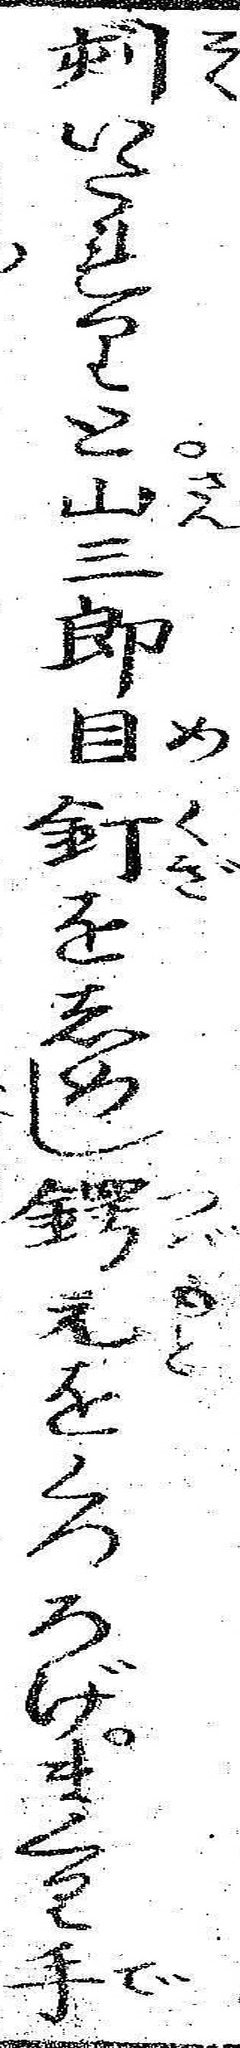刻いたれりと。山三郎目釘をしめし鍔元をくつろげ。まくり手
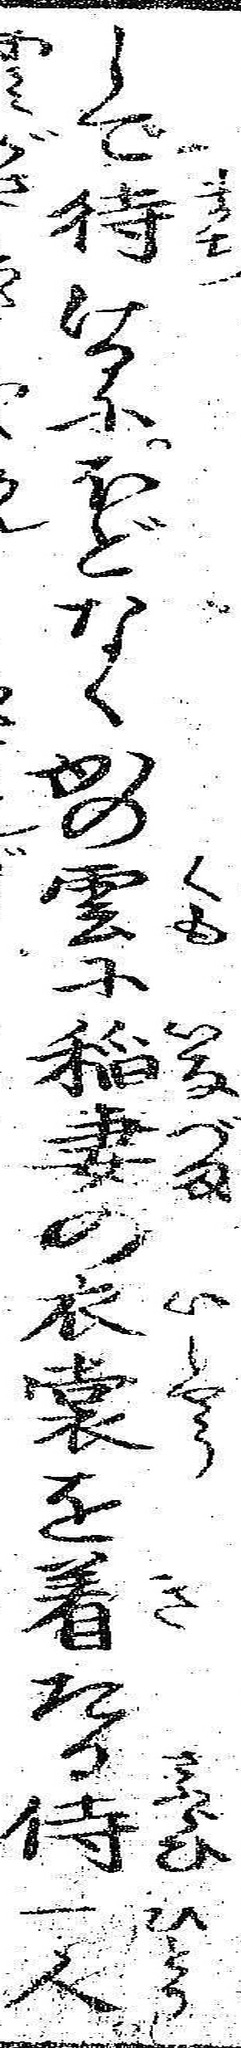して。待けるに。ほどなくかの雲に稲妻の衣裳を着たる侍一人
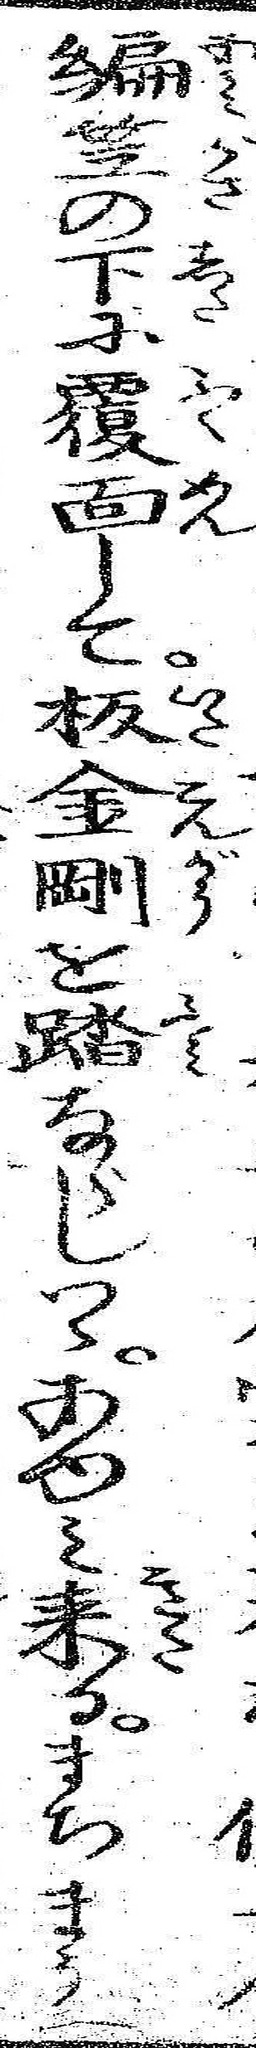編笠の下に覆面して。板金剛を踏ならしつゝ。あゆみ来る。まちまう
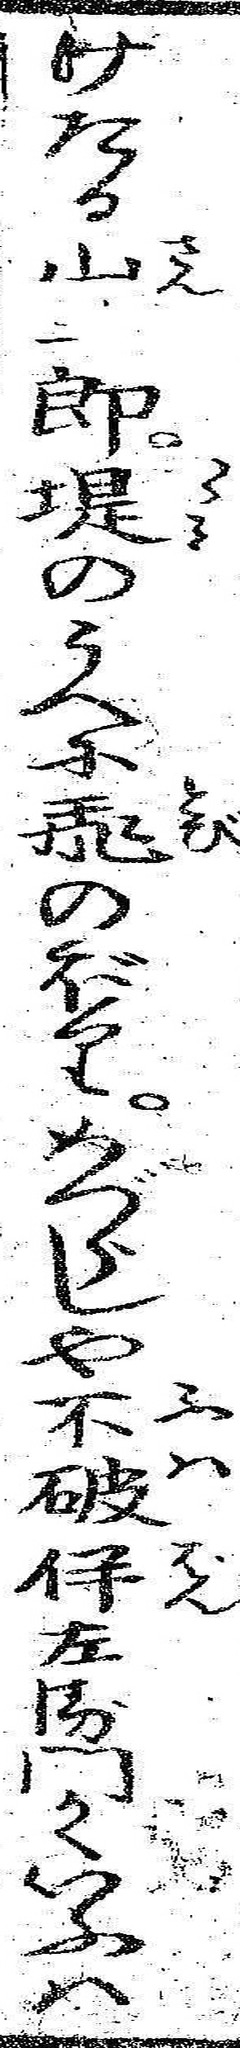けたる山三郎。堤のうへに飛のぼり。めづらしや不破伴左衛門かくいふは

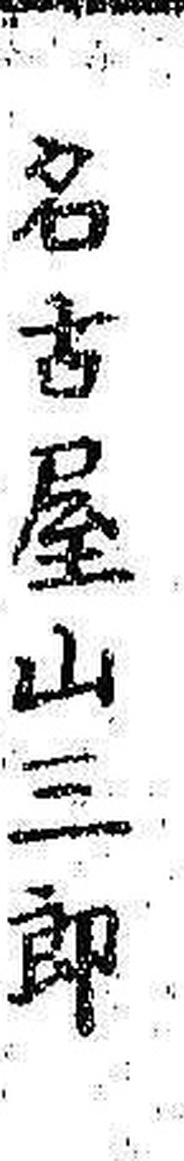名古屋山三郎
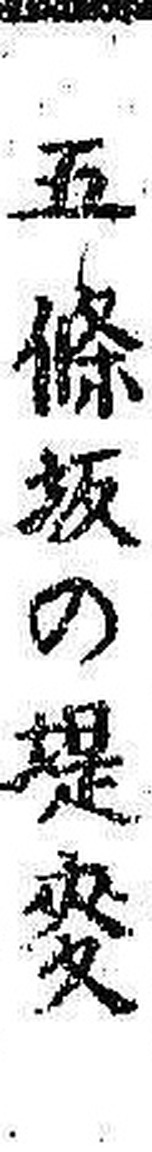五条坂の堤麦
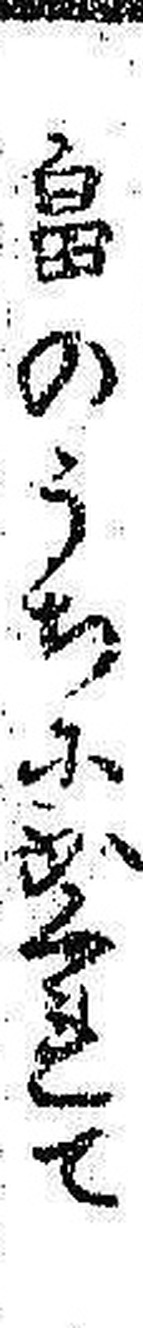畠のうちにかくれて
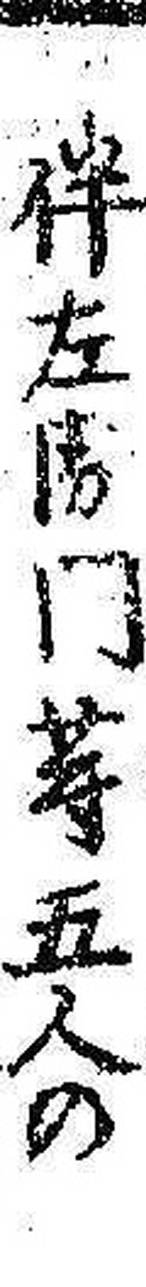伴左衛門等五人の
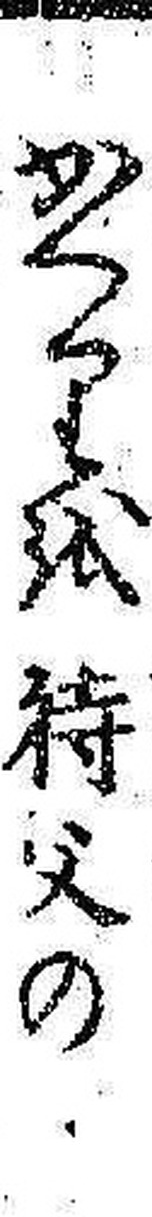かへりを待父の
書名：昔話稲妻表紙
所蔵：国文学研究資料館
